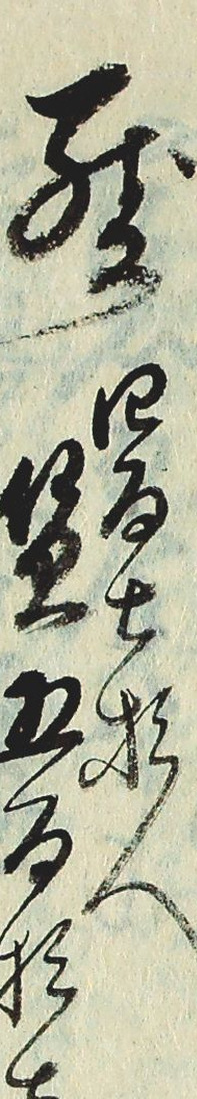残て四百七拾人
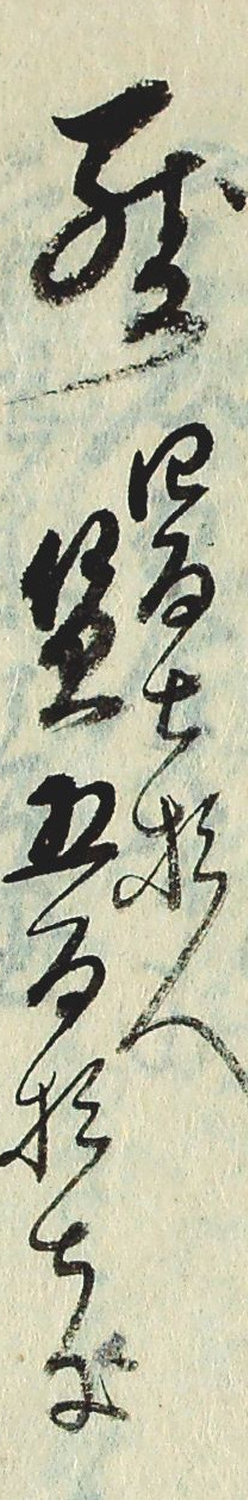賃五百拾七匁
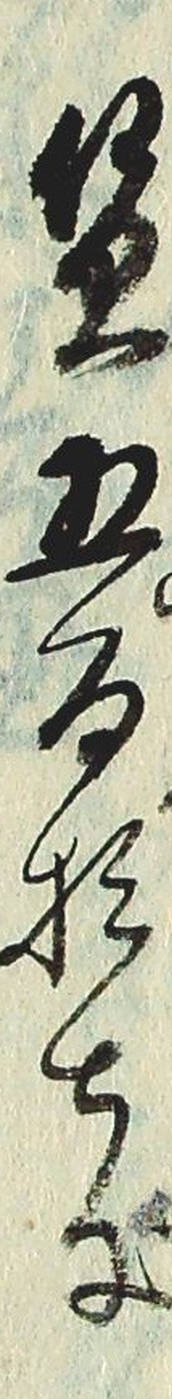賃五百拾七匁
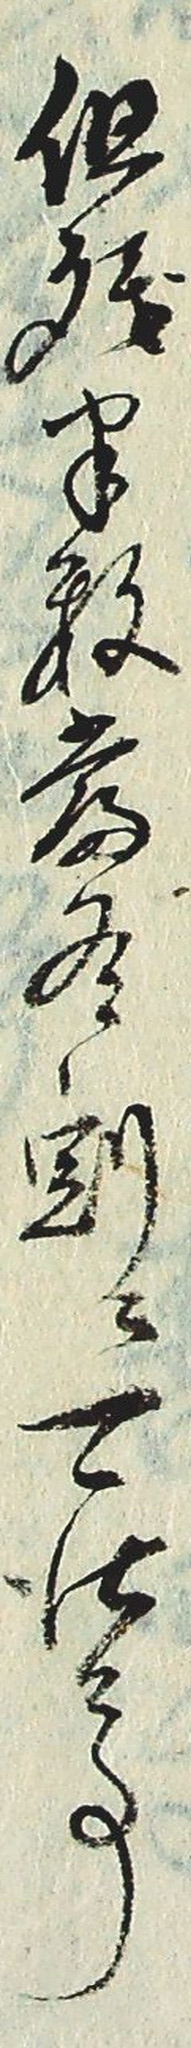但残半数当冬割に可仕候事

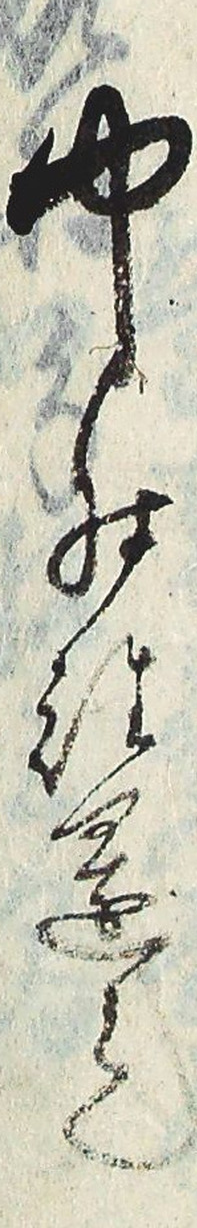中村往還迄
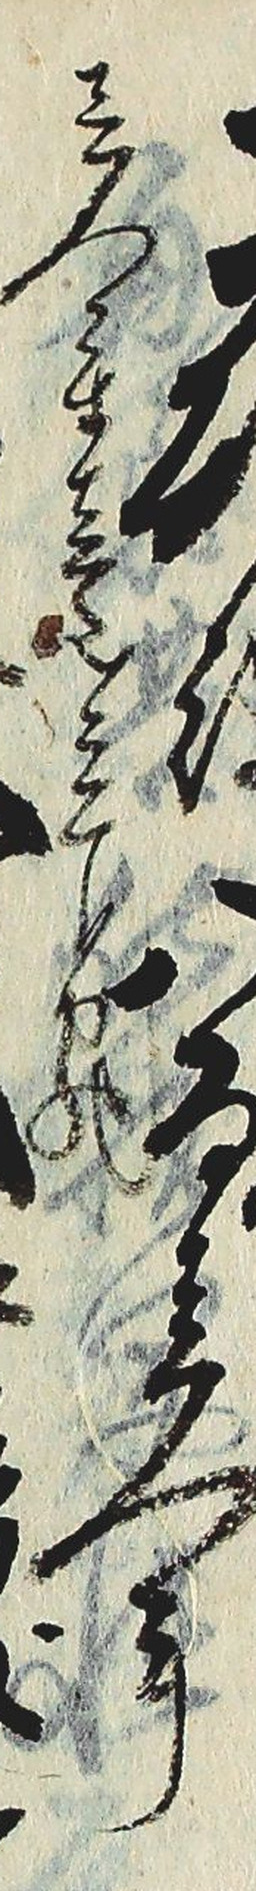壱人に付壱匁壱分宛
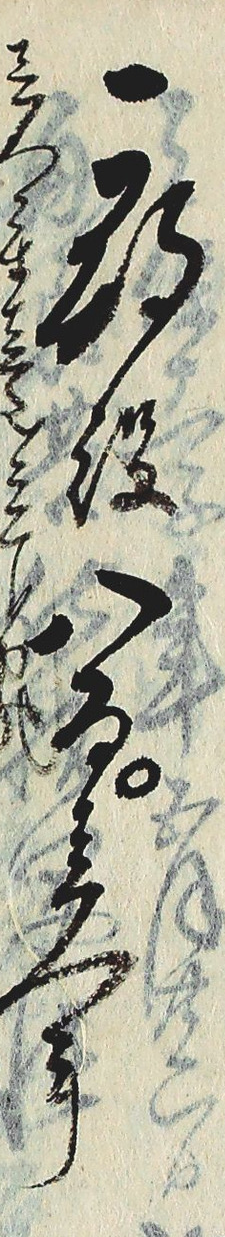一郡役八百〇壱人半
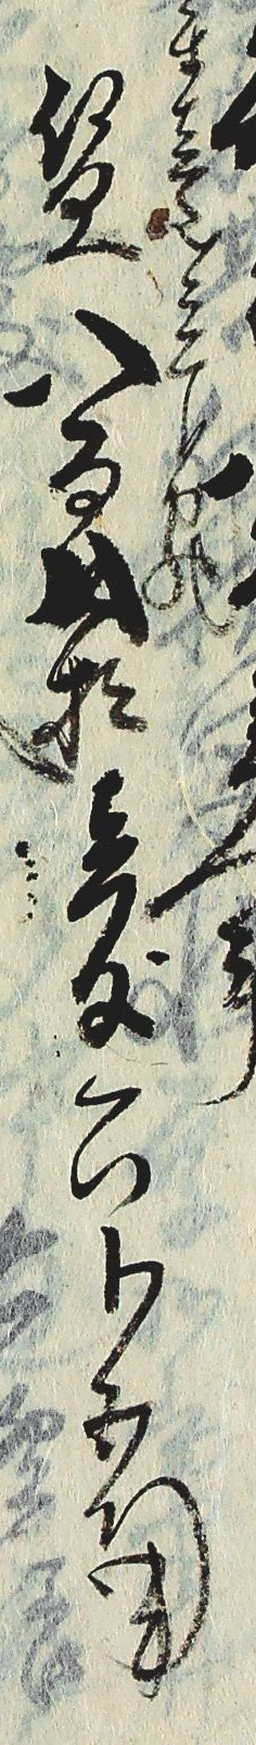賃八百八拾壱匁六分五厘
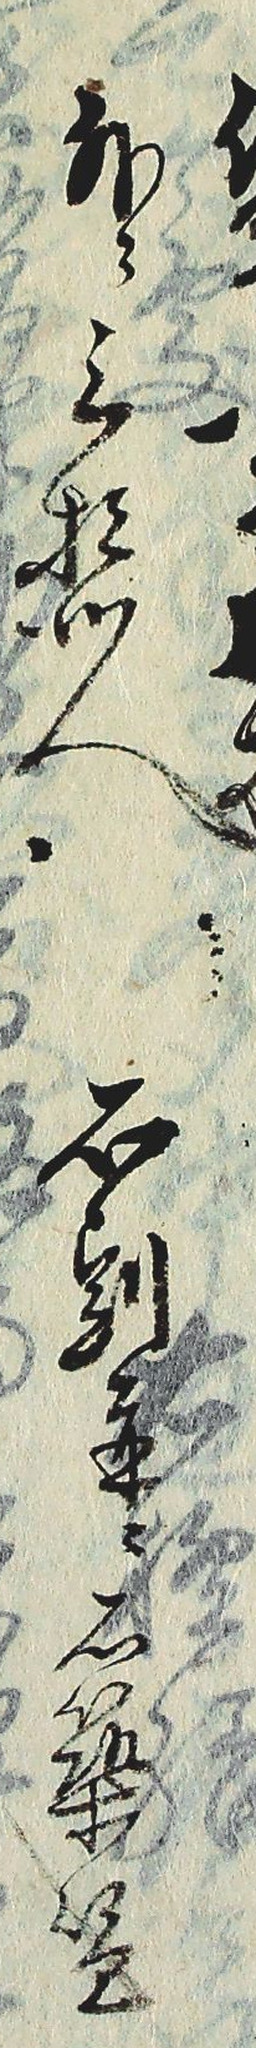外に三拾弐人石割并石築賃
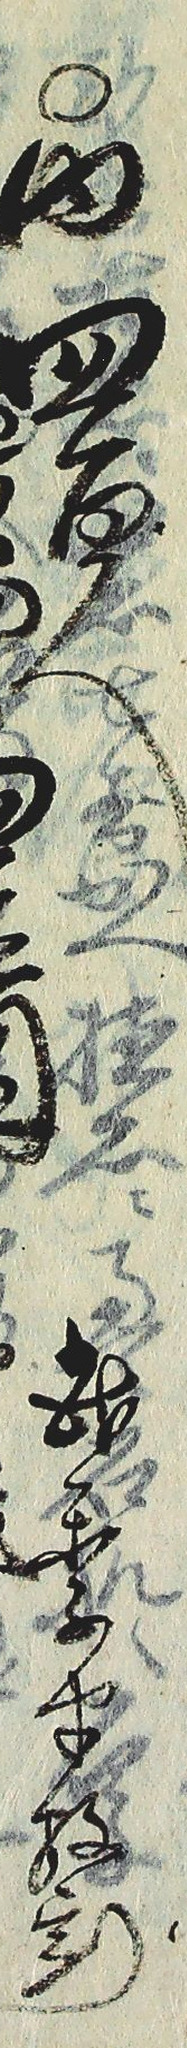内四百人当季半数割
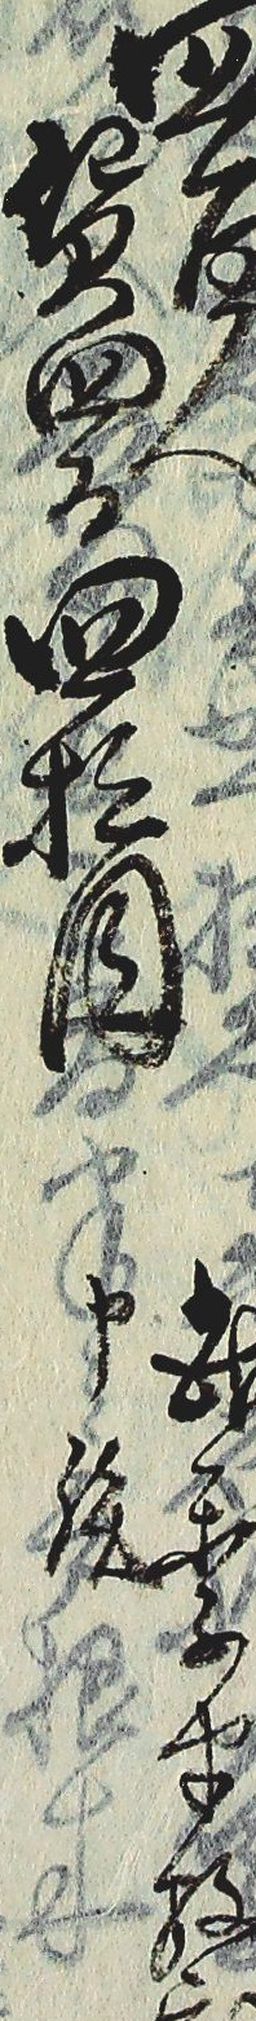賃四百四拾目申談
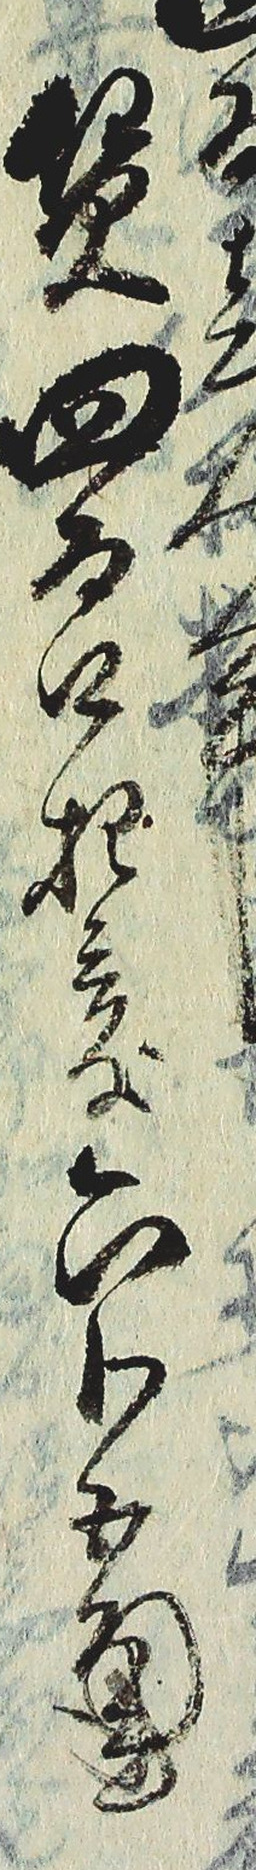賃四百四拾壱匁六分五厘
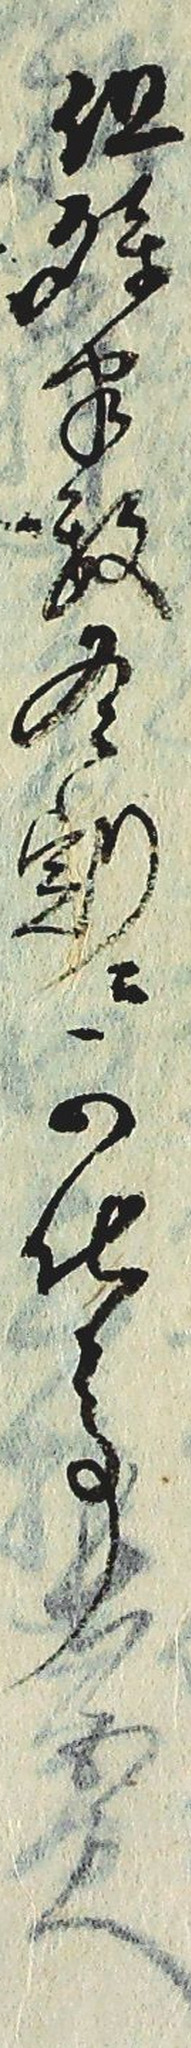但残半数冬割に可仕事

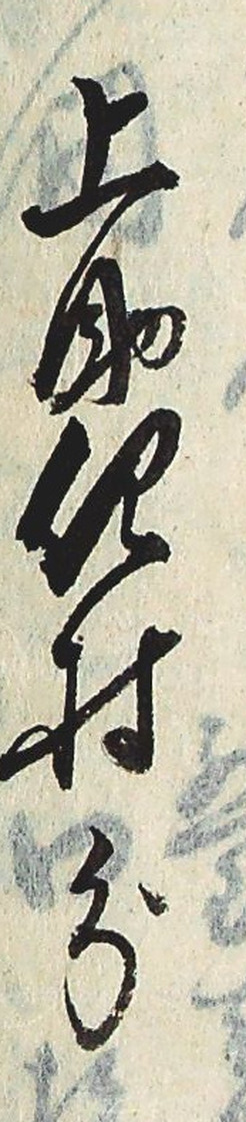上助任村分
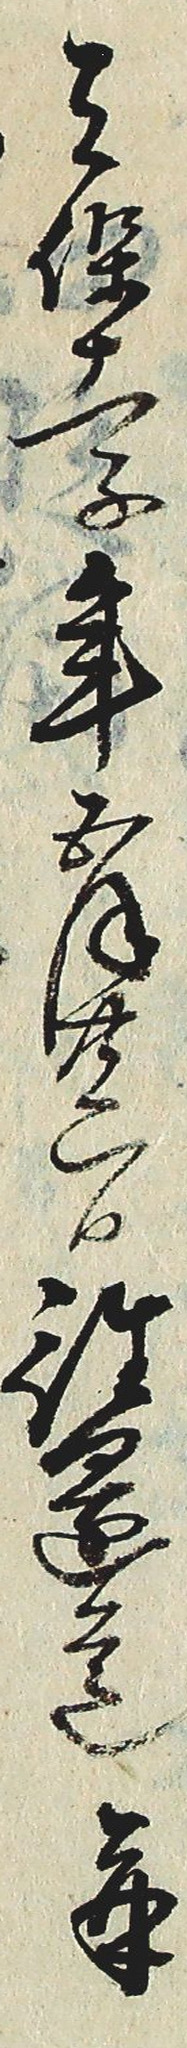天保十一子年五月廿二日往還道并
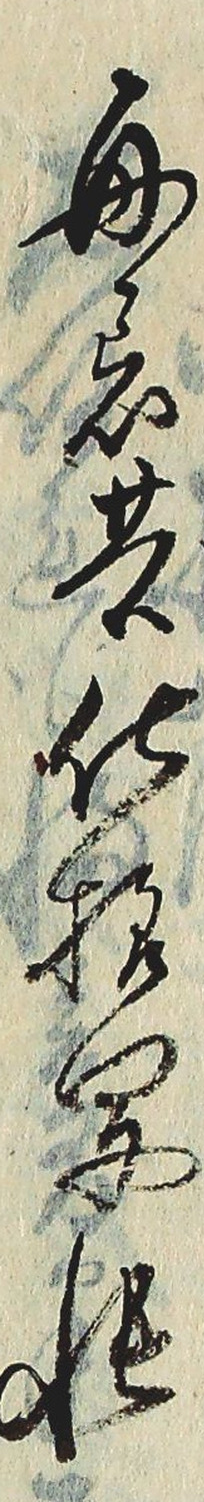舟着共仕様写帳
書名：名東郡中諸割賦元帳
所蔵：鳴門教育大学 Naruto University of Education
